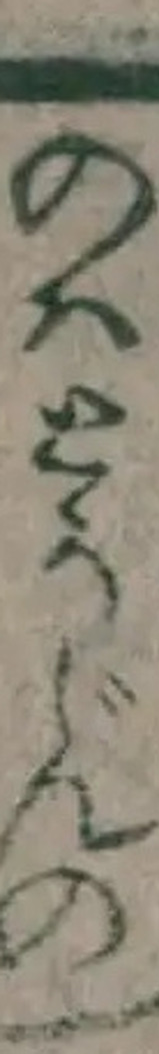のはとうじんの
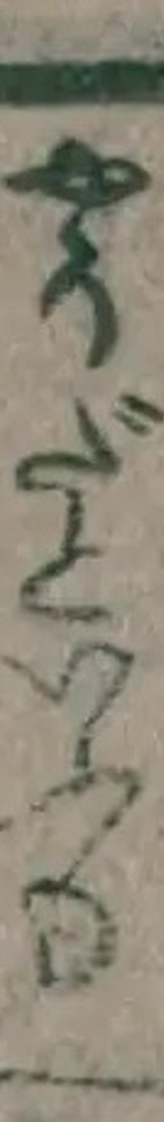やうだといふも
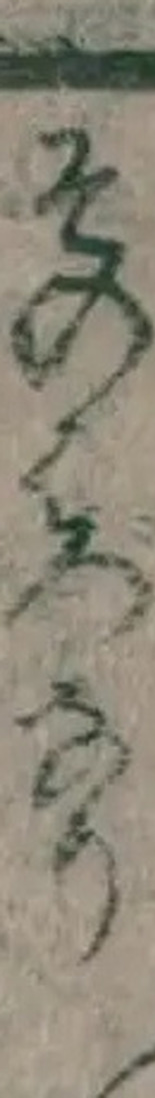そのはづなり
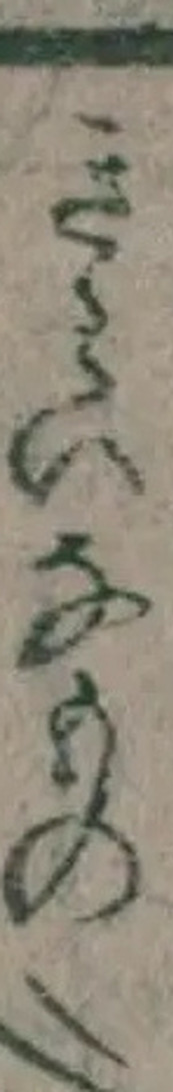きらいなもの
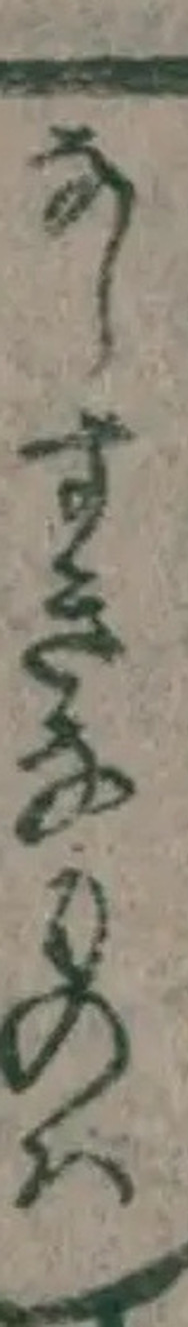なしすきなものは
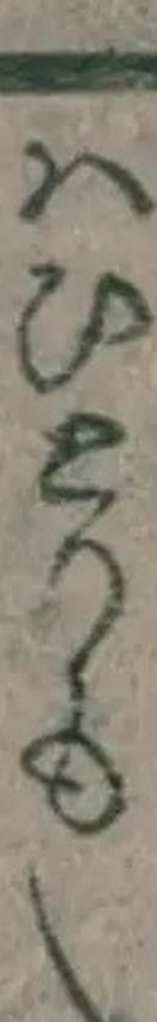はひとりも
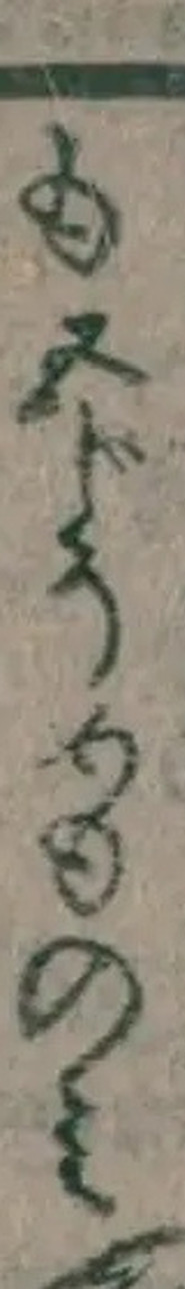も五じうめものみ
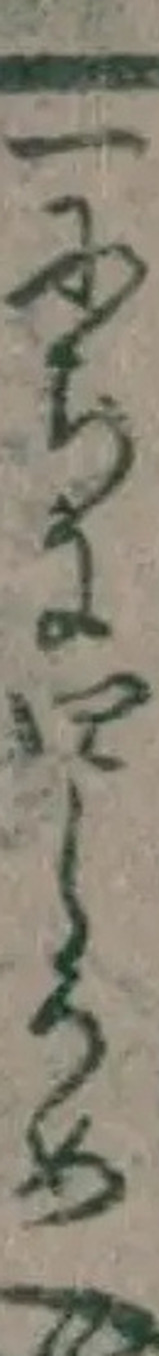一にちに四しうめ
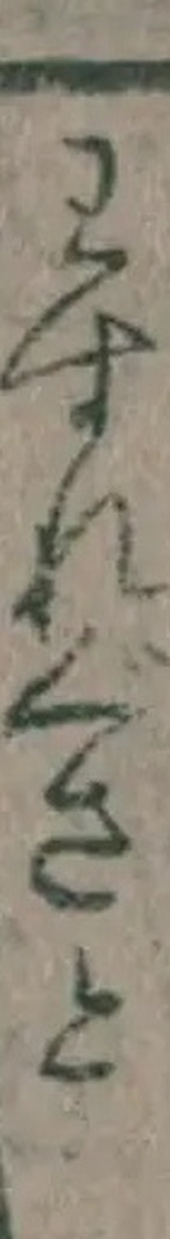わすれぐさと
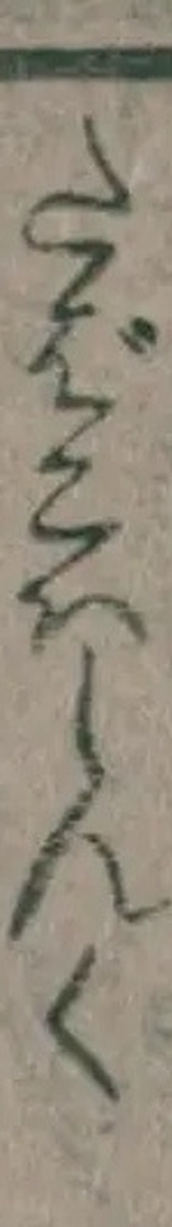たばこはしんく
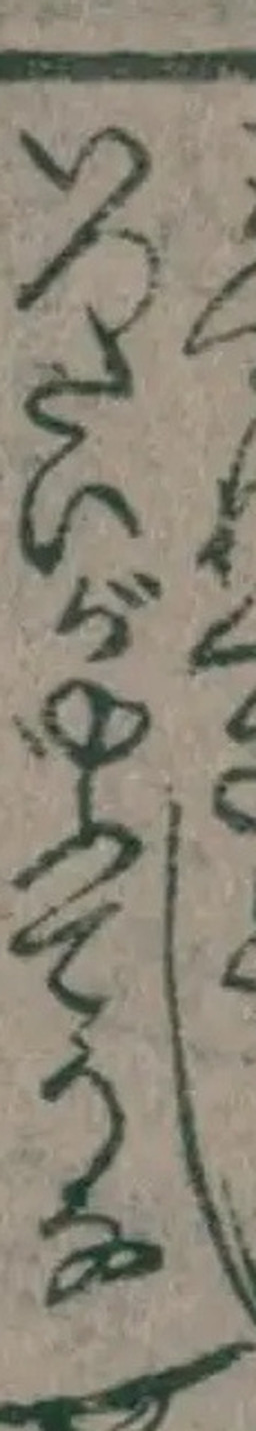いつたいがゆふてうな
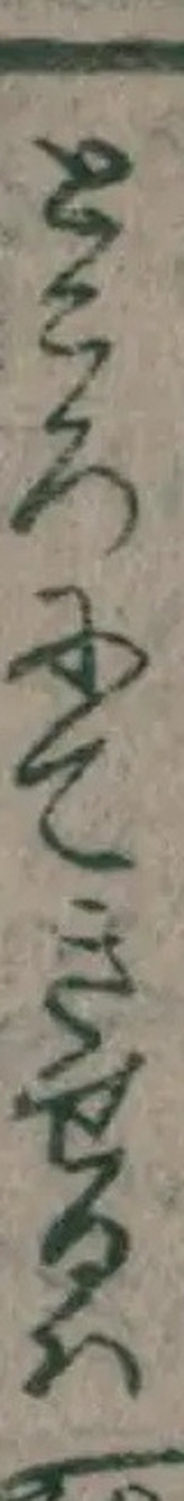ところにてきせるは
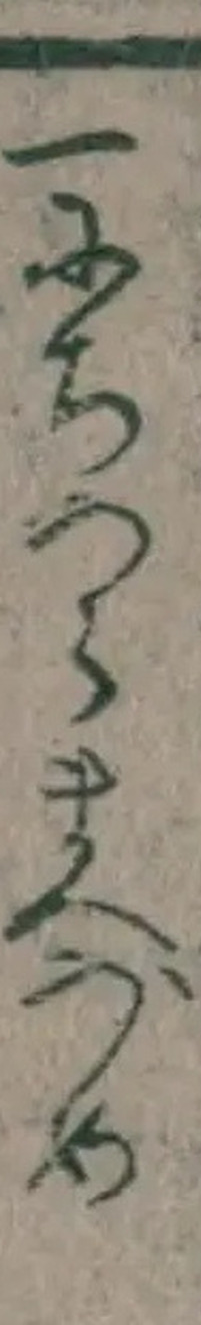一にちつかまへつめ
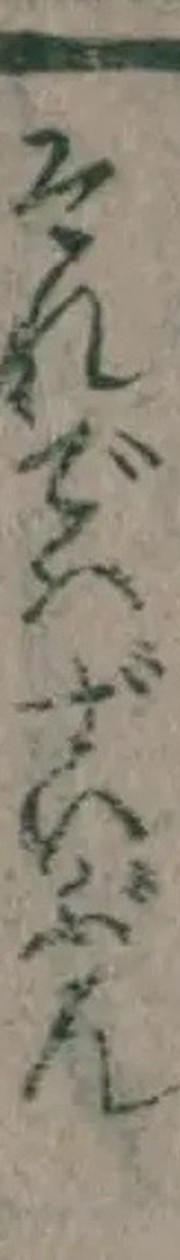それではずいぶん
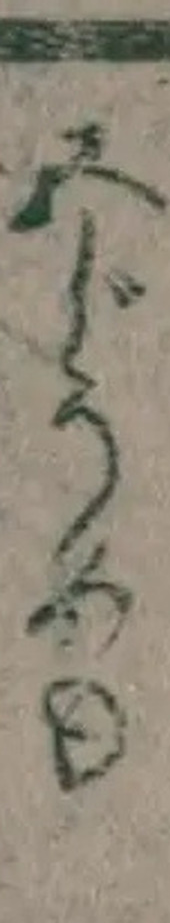五じうめも
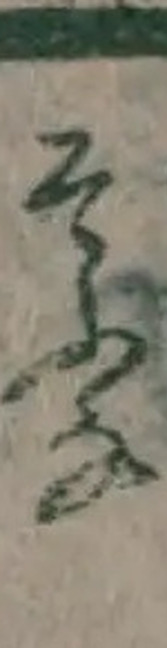そふな
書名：縦筒放唐の噺 3巻
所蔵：国立国会図書館 National Diet Library, JAPAN
